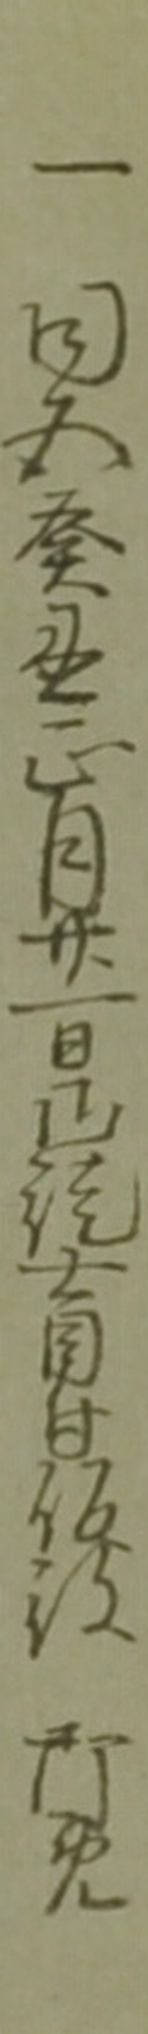一同五癸丑正月廿一日御徒士目付仮役御免
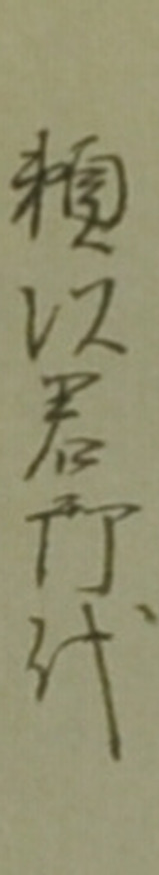頼以君御代
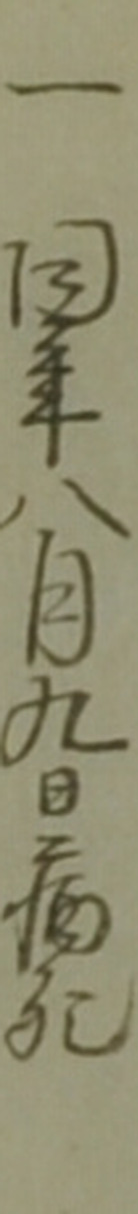一同年八月九日病死
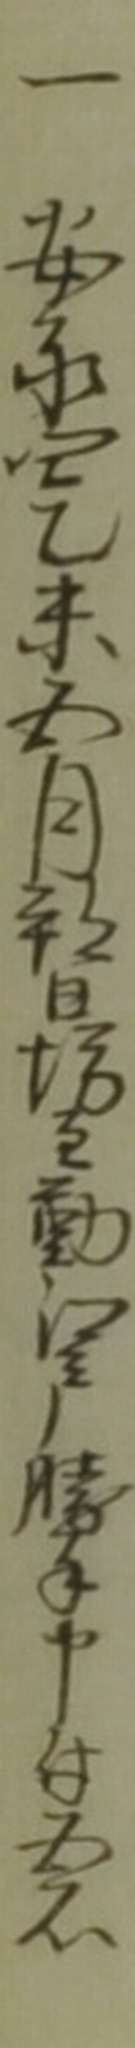一安永四乙未五月朔日坊主勤江戸勝手申付五石
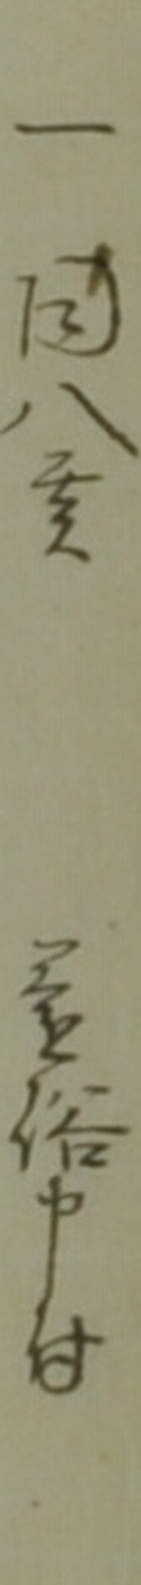一同八亥還俗申付
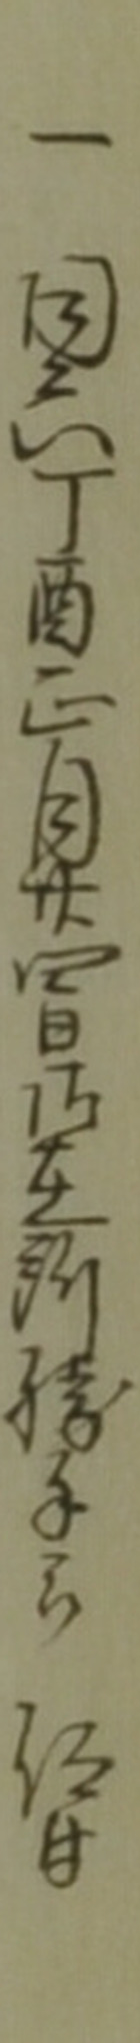一同六丁酉正月廿四日御在所勝手被仰付
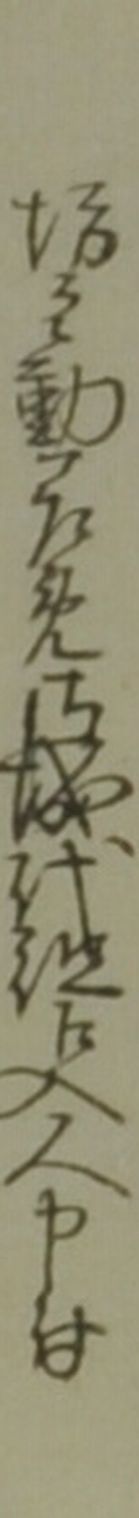一坊主勤差免御城代組江入人申付
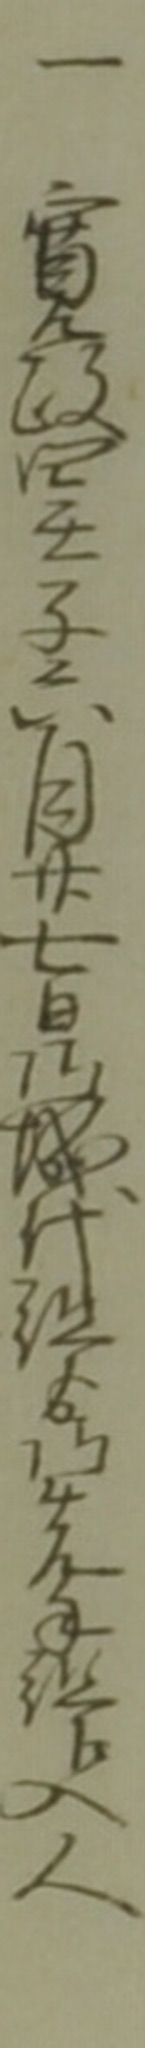一寛政四壬子六月廿七日御城代組ゟ御先手組江入人
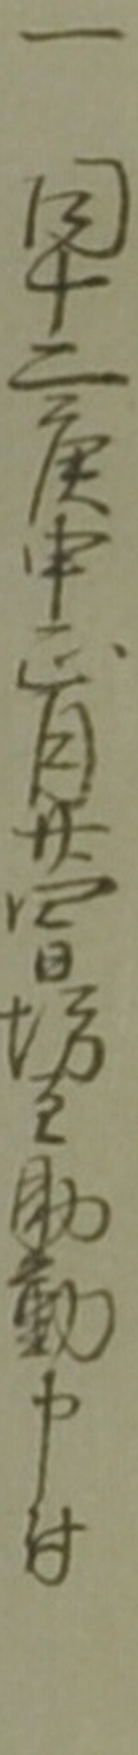一同十二庚申史料正月廿四日坊主助勤申付
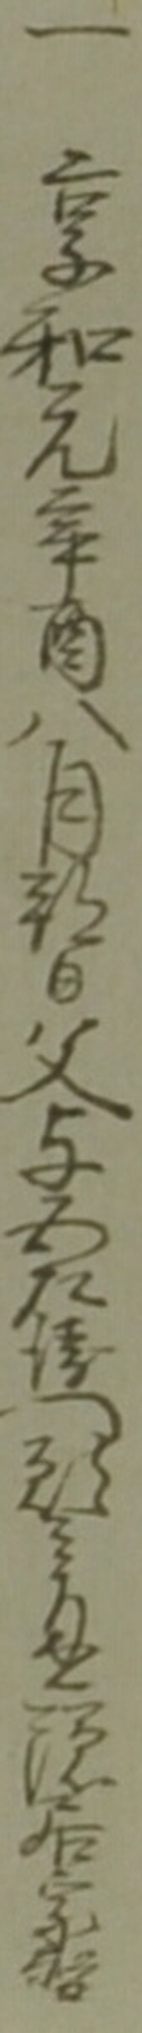一享和元辛酉八月朔日父与五左衛門願之通隠居家督
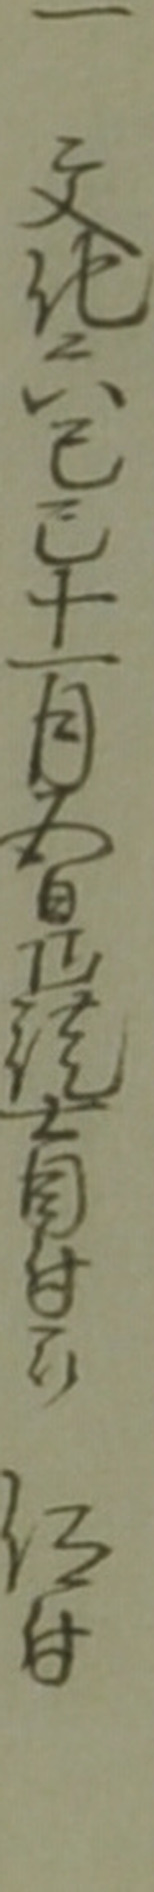一文化六己巳十一月五日御徒士目付被仰付
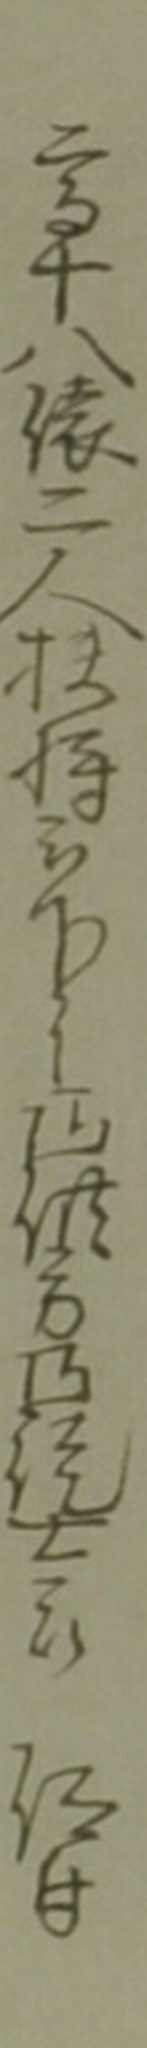高十八俵二人扶持被下之御供方徒士被仰付
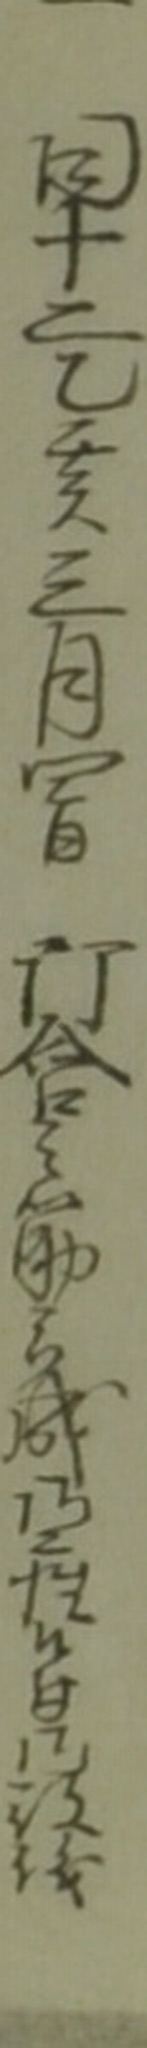一同十二乙亥三月四日御含之筋被成御座候付御役儀
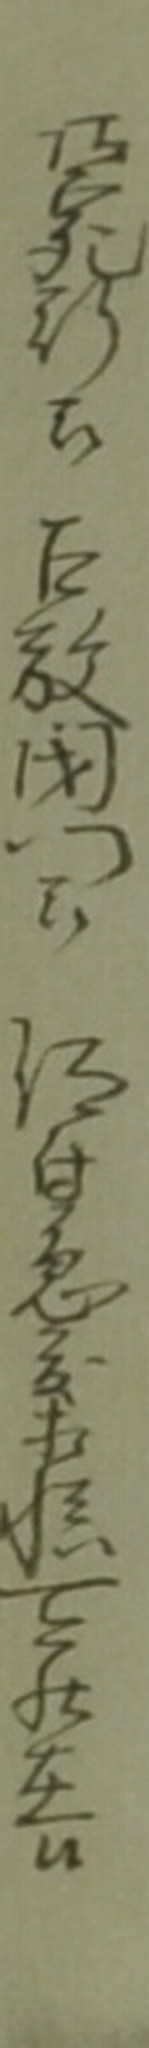御宛行被召放閉門被仰付急度相慎可罷在候
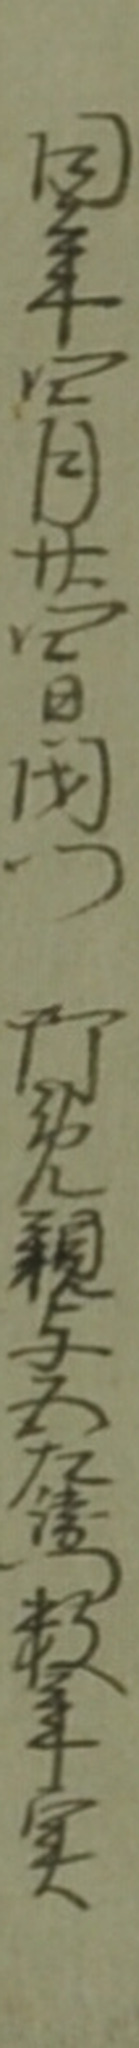一同年四月廿四日閉門御免親与五左衛門数年実
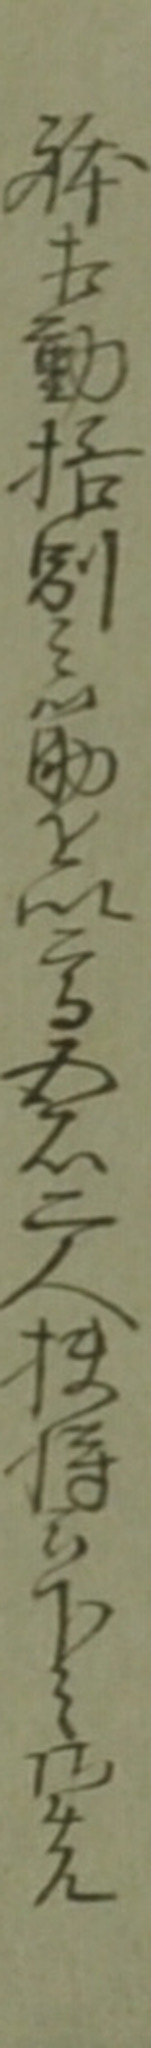躰相勤格別之筋を以高五石二人扶持被下之御先
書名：無足諸士勤仕録（九）
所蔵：伊那市立高遠町図書館・合同会社AMANE
